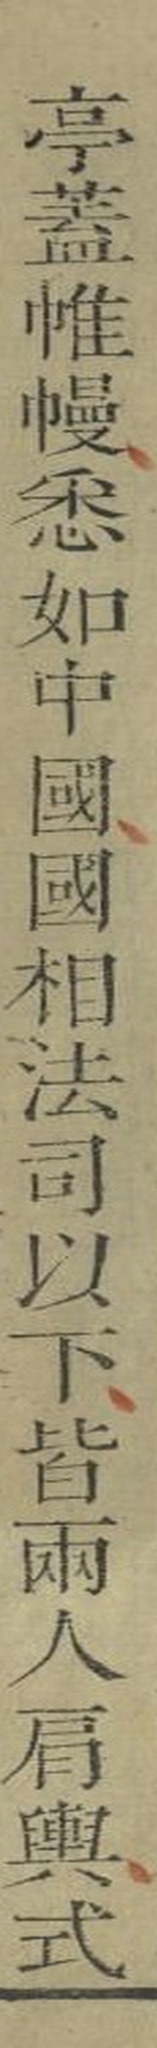亭蓋帷幔悉如中国国相法司以下皆両人肩輿式
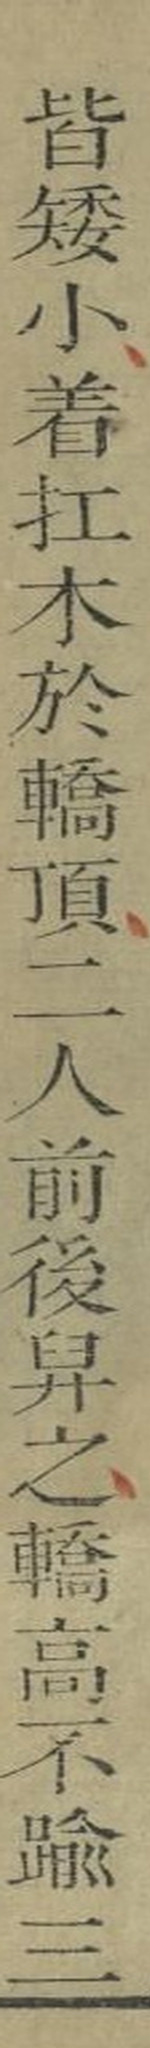皆矮小着扛木於轎頂二人前後舁之轎高不踰三
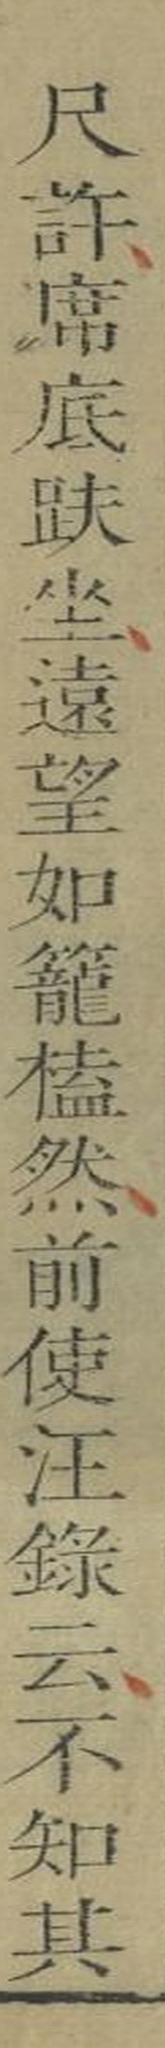尺許席底趺坐遠望如篭榼然前使汪録云不知其
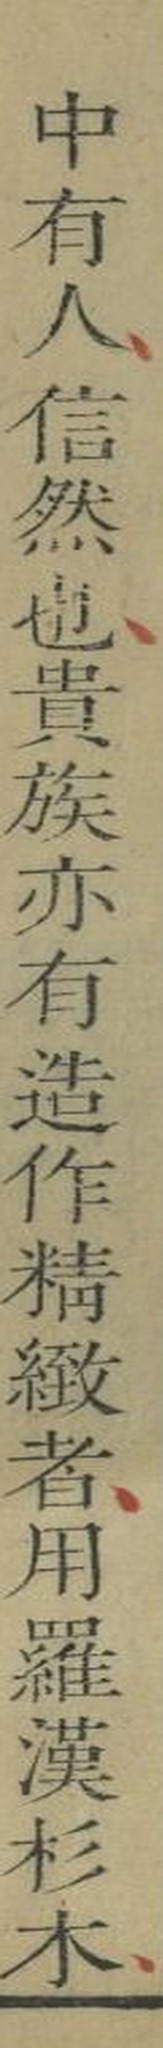中有人信然也貴族亦有造作精緻者用羅漢杉木
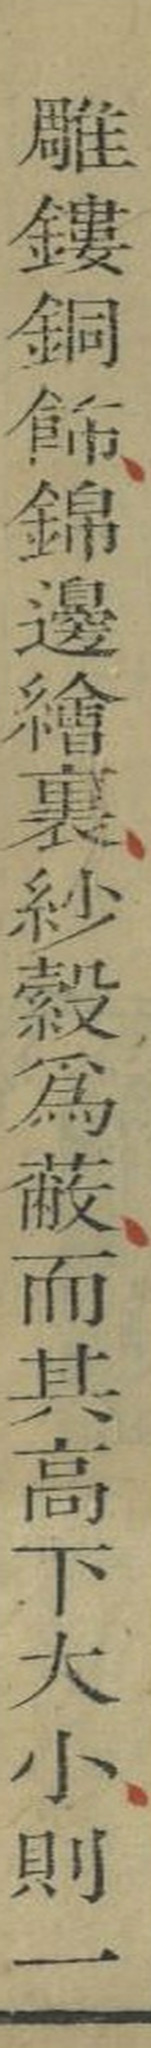雕鏤銅飾錦辺絵裏紗縠為蔽而其高下大小則一
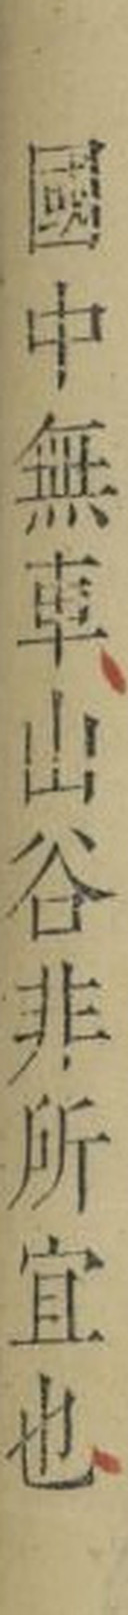国中無車山谷非所宜也
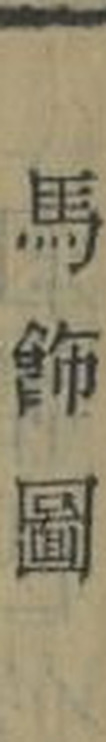馬飾図

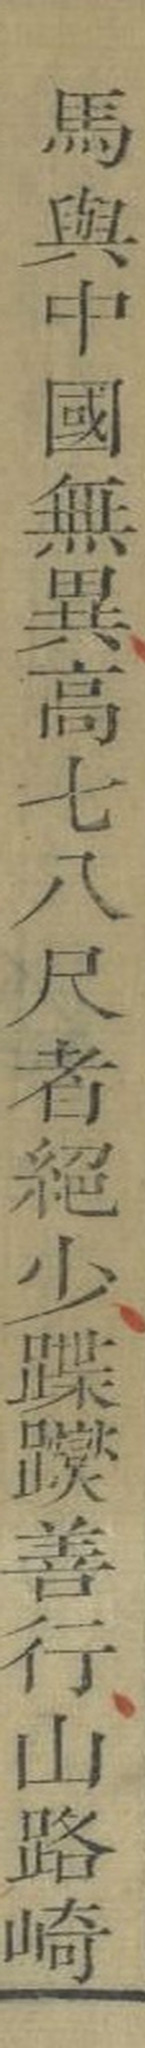馬与中国無異高七八尺者絶少蹀躞善行山路崎
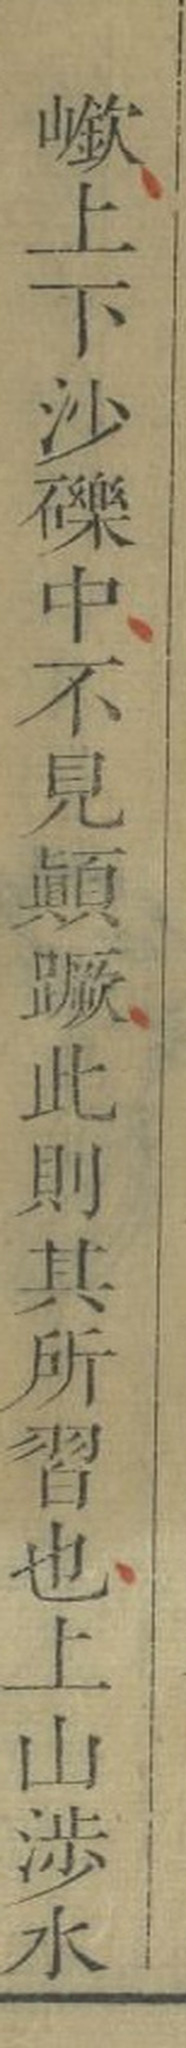嶔上下沙礫中不見顚蹶此則其所習也上山渉水
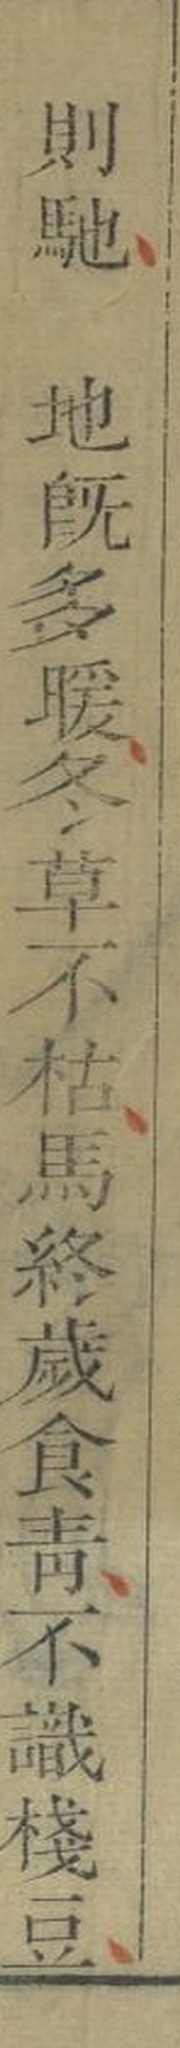則馳地既多暖冬草不枯馬終歳食青不識桟豆
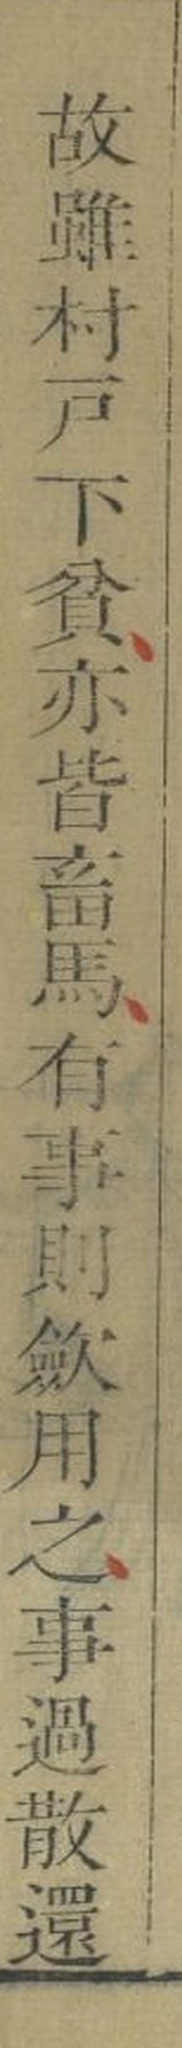故雖村戸下貧亦皆畜馬有事則歛用之事過散還
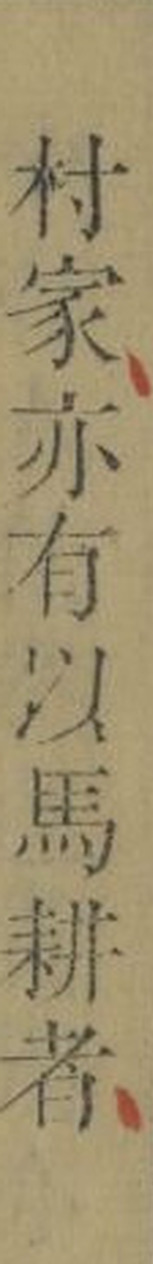村家亦有以馬耕者
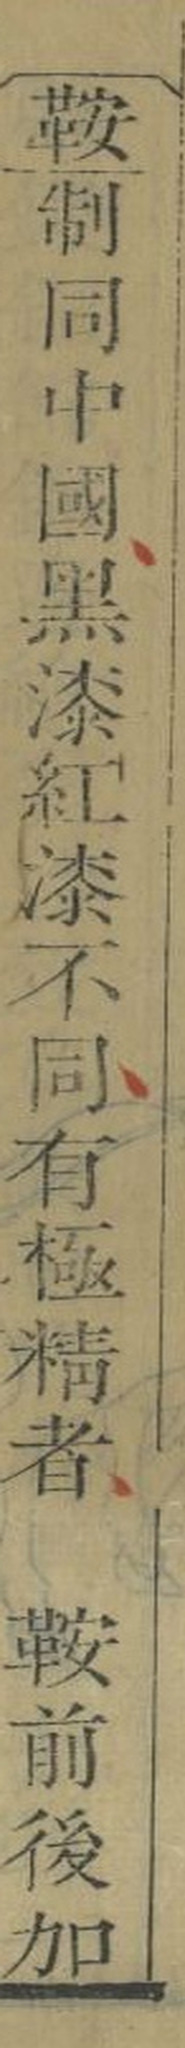[鞍]制同中国黒漆紅漆不同有極精者鞍前後加
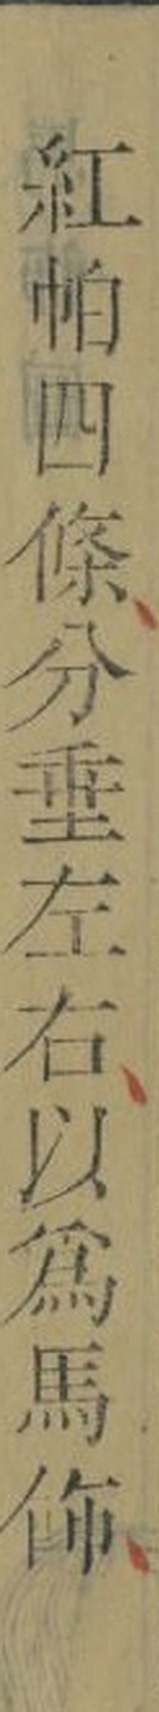紅帕四条分垂左右以為馬飾
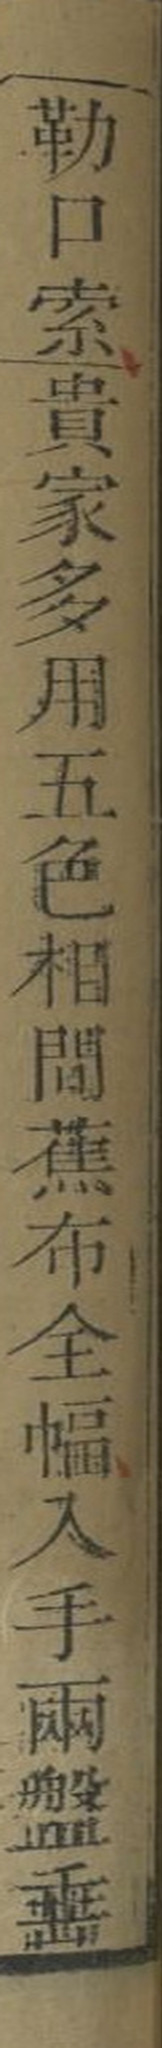[勒口索]貴家多用五色相間蕉布全幅入手両盤垂
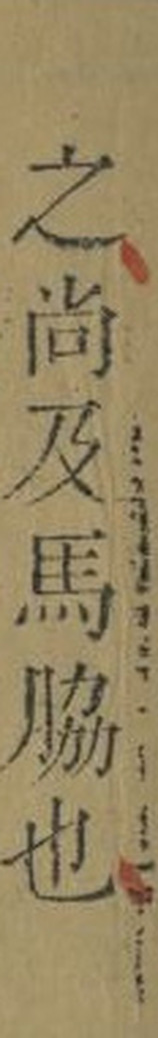之尚及馬脇也
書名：中山伝信録 巻六
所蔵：University of the Ryukyus Library
